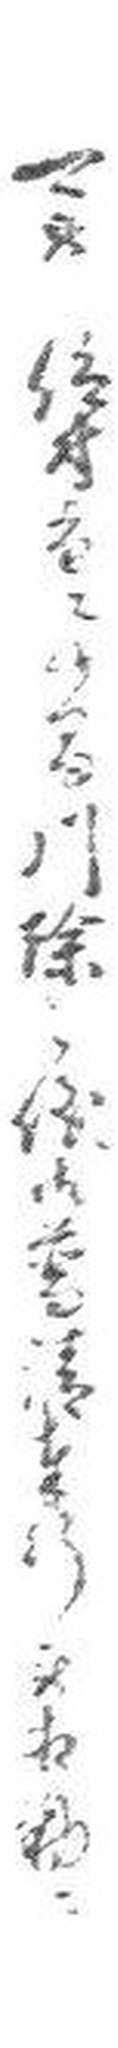可被仰付旨ニ候間川除之儀御普請奉行被相勤ニ
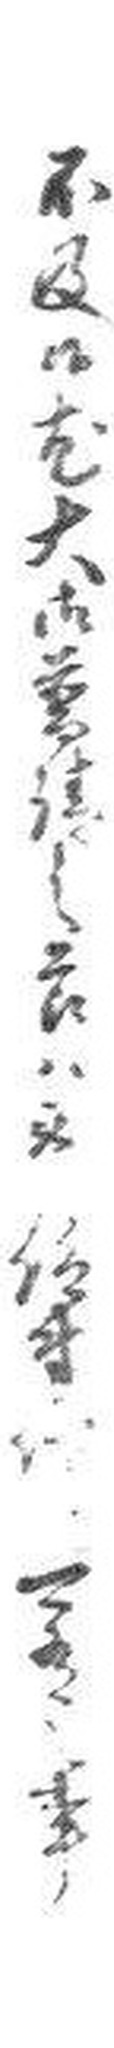不及候尤大普請之節ハ被仰付儀可有之事
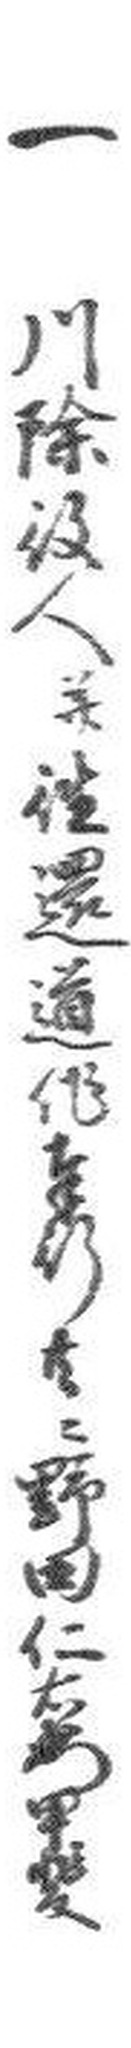一川除役人并往還道作奉行共ニ野田仁右衛門甲斐

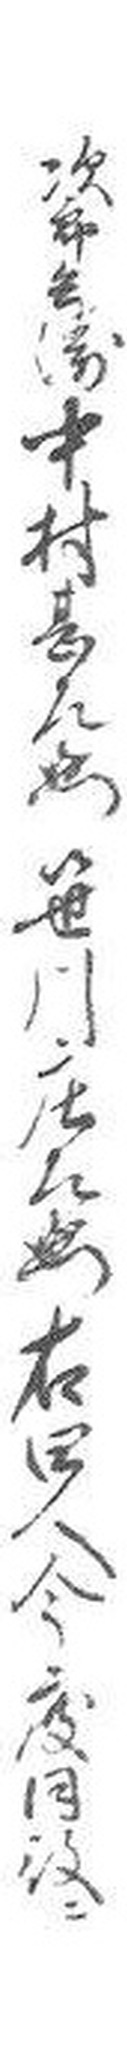次郎兵衛中村甚左衛門笹川庄左衛門右四人今度同役ニ
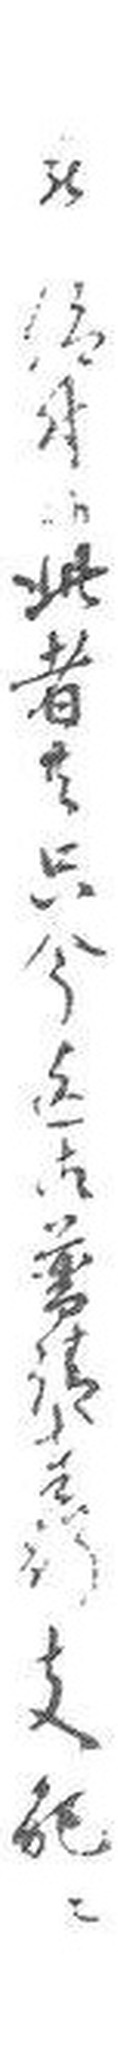被仰付候此者共只今迄御普請奉行支配ニ
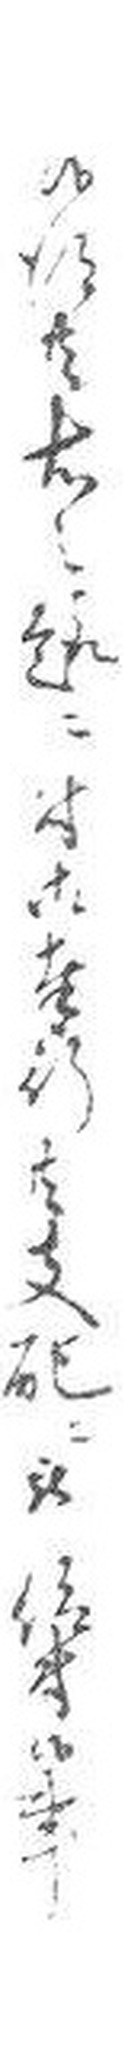候得共右之趣ニ付御奉行共支配ニ被仰付事
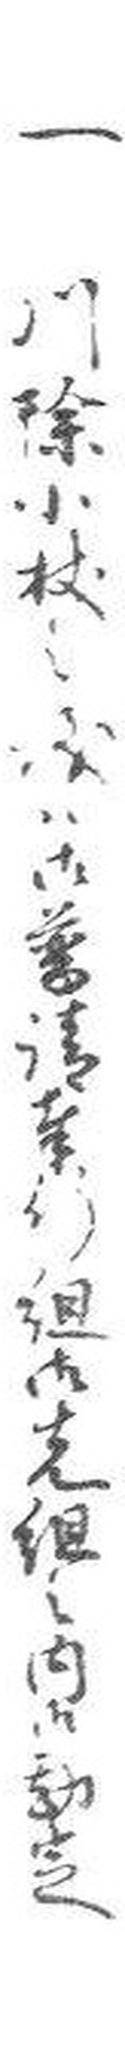一川除小杖之儀ハ御普請奉行組御先組之内御勘定
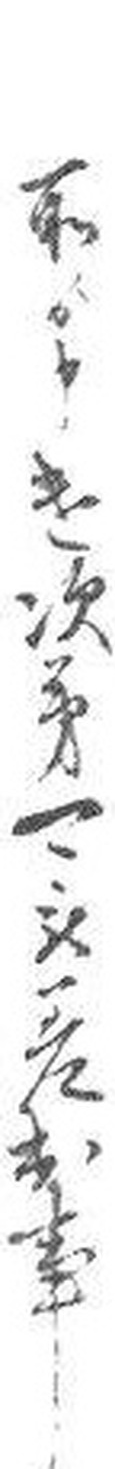所ゟ申遣次第可被差出事
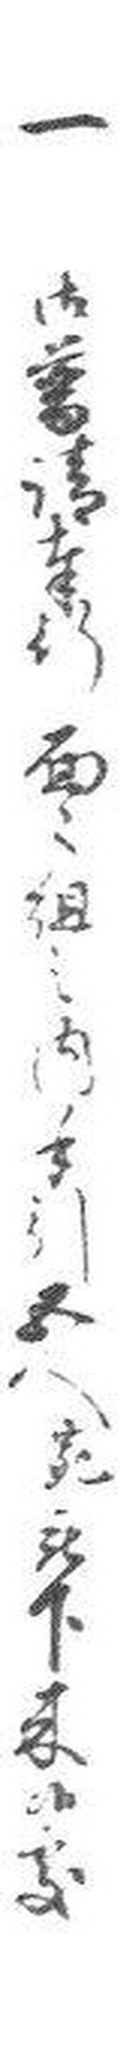一御普請奉行面々組之内手引五人宛被下来候処
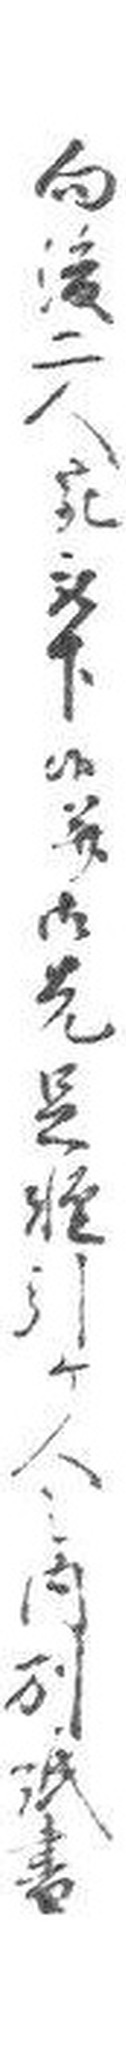向後二人宛被下候并御先足軽引ケ人之内別紙書
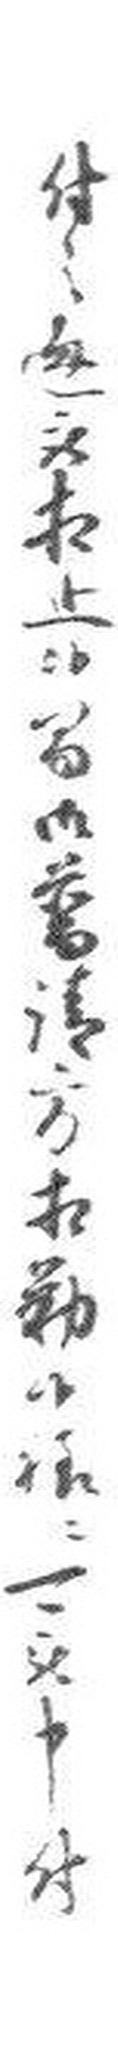付之通被相止候間御普請方相勤候様ニ可被申付
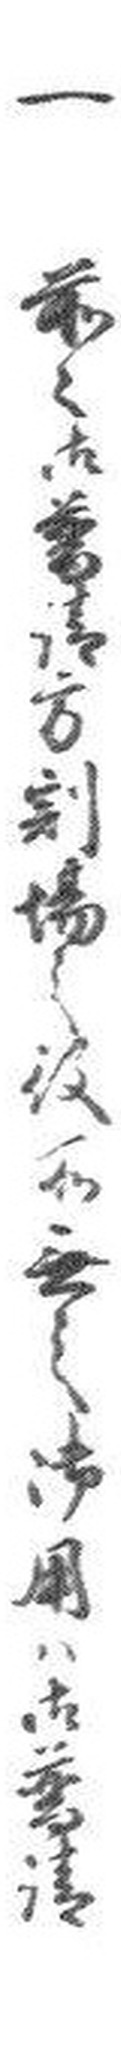一前々御普請方割場之役所無之御用ハ御普請
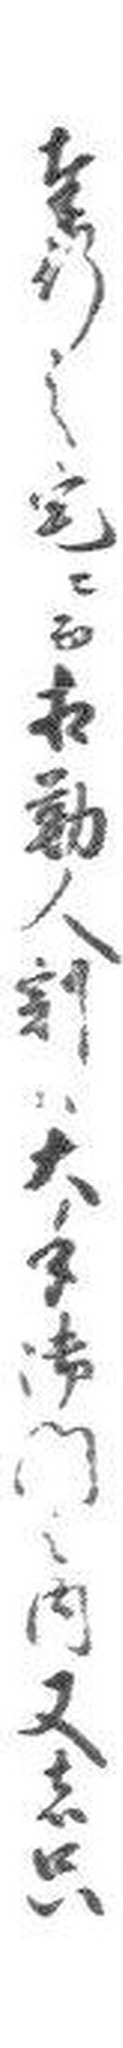奉行之宅ニ而相勤人割ハ大手御門之内又者只
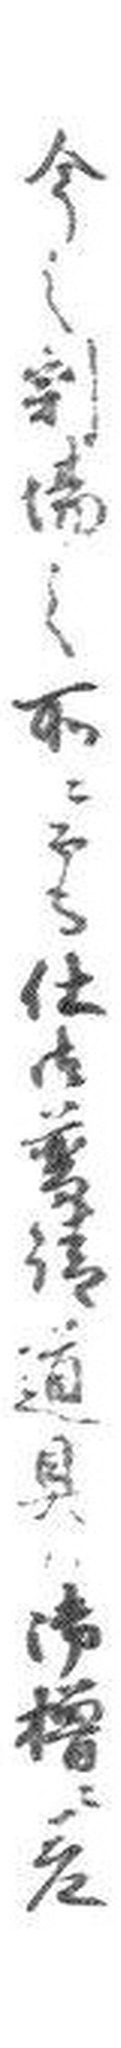今之割場之所ニ而者仕御普請道具ハ御櫓ニ差
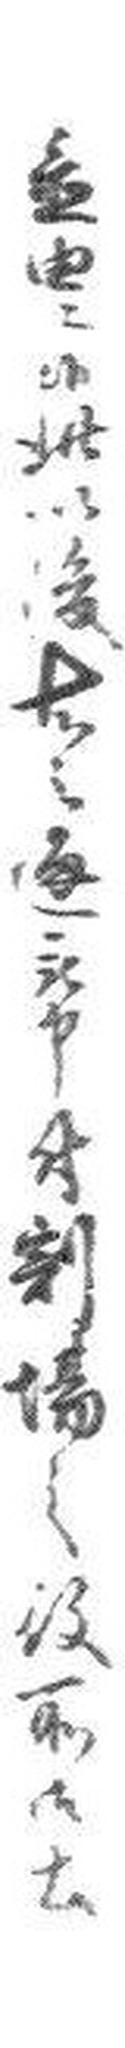置由ニ候此以後右之通被申付割場之役所御土
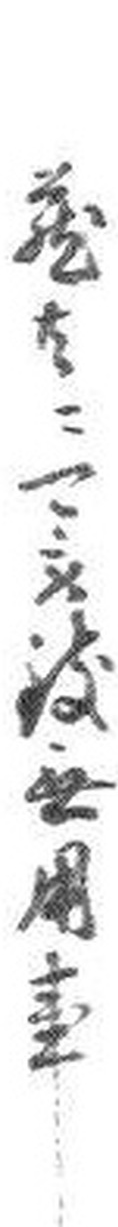蔵共ニ可被致無用事
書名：家譜 二十九 吉邦公 従正徳二年到正徳三年
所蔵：福井県文書館 Fukui Prefectural Archives
